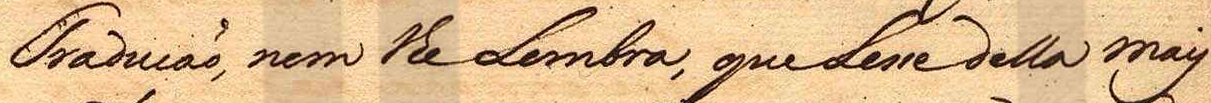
Traduçaõ, nem lhe Lembra, que Lesse della mais
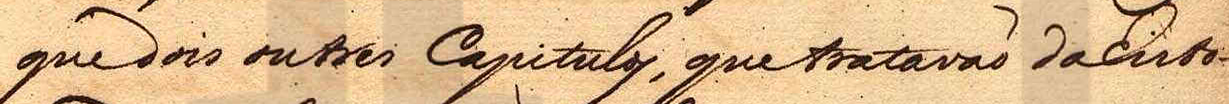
que dois outros Capitulos, que tratavaõ da histo
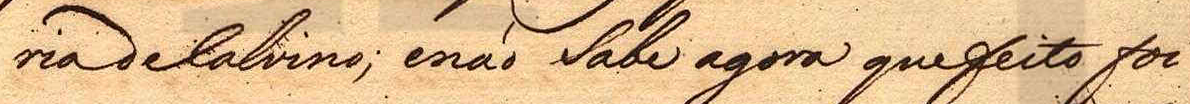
ria de Calvino, e naõ Sabe agora que feito foi
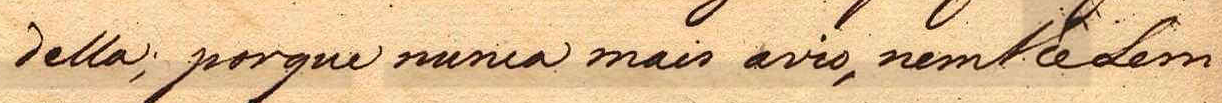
della; porque nunca mais a vio, nem lhe Lem
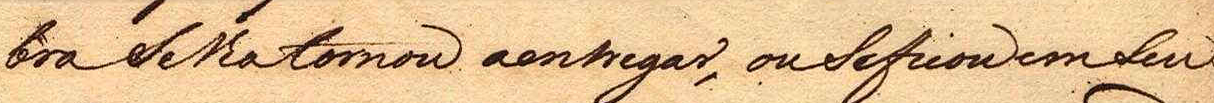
bra Se lha tornou a entregar, ou Se ficou em Seu
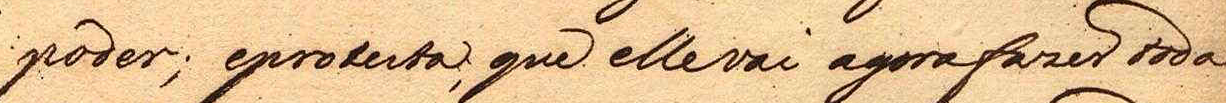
poder; e protesta, que elle vai agora fazer toda
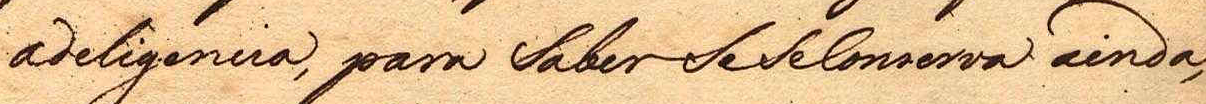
a deligencia, para Saber Se Se conserva ainda,
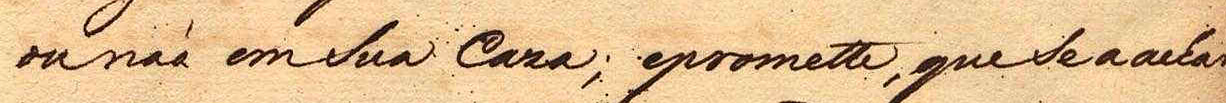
ou naõ em Sua Caza; e promette, que Se a achar
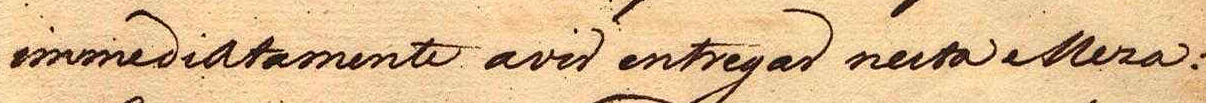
immediatamente a vir entregar nesta Meza:
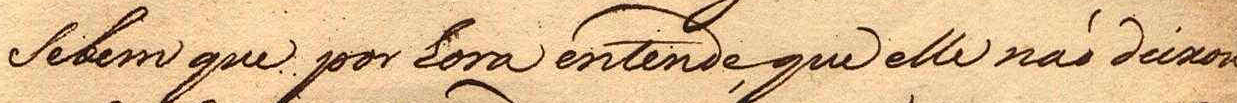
Se bem que por hora entende, que elle naõ deixou
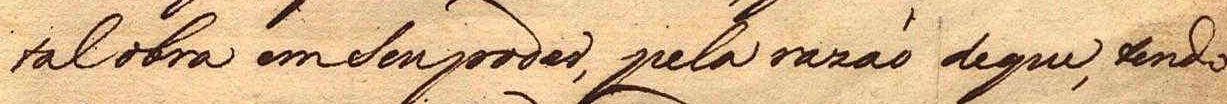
tal obra em Seu poder, pela razaõ de que, tendo
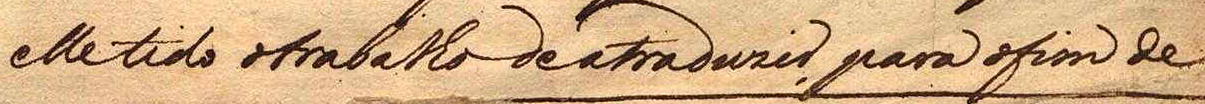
elle tido o trabalho de a traduzir, para o fim de
